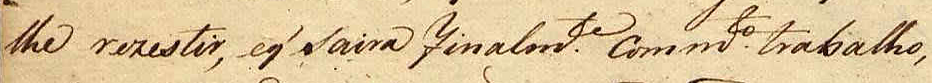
lhe rezestir, e q̄ saira finalm.te com m.to trabalho,
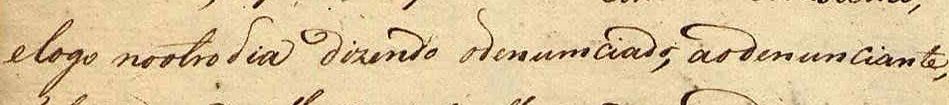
e logo no otro dia dizendo o denunciado, ao denunciante,
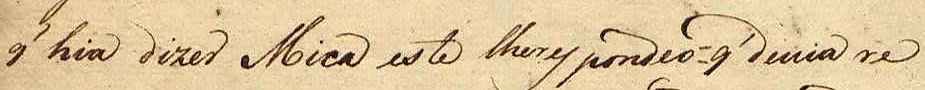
q̄ hia dizer Mica este lhe respondeo q̄ deuia re
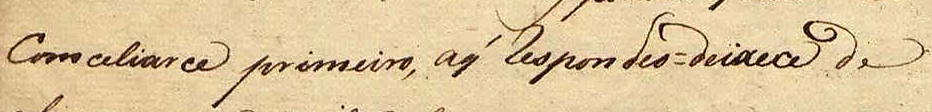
Comceliarce primeiro, a q̄ Respondeo= deixece de
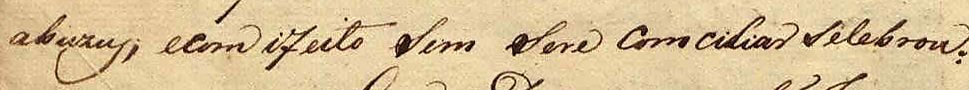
abuzus, e com ifeito Sem Se recomciliar selebrou:
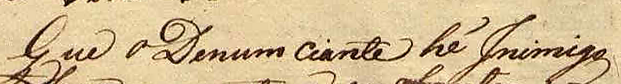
Que o Denumciante hé Jnimigo
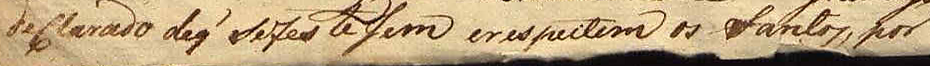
deClarado de q̄ se festejem e respeitem os Santos, por
